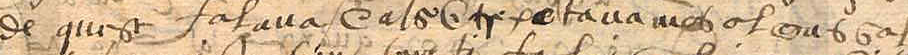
de que se falaua / e a Iso ētrepetauamos algus sal
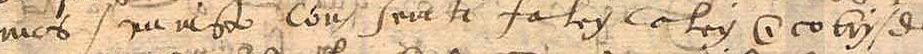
mos / eu nisto Comsemti faley Caley ēcobry /de
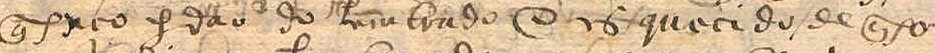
q̄ peco ꝑdao do lembrado e esquecido de q̄ por
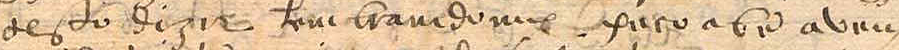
testo dizer lembrandome . peco a bē avem
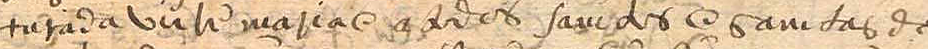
turada virIē maria e a todos samtos e samtas da
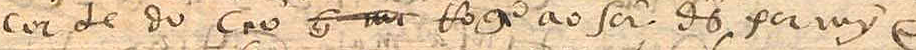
Corte do Ceō h me Rogē ao sor̄ ds̄ por mȳ e
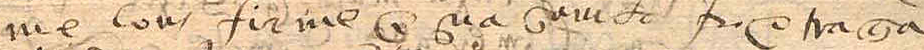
me Comfirme ē sua samta fee e traga
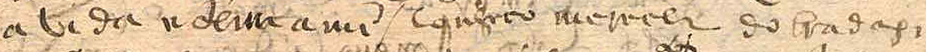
a vida eterna amē / Conheco merecer dobrada pe
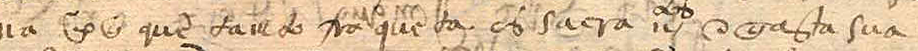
na p̄q̄ quē tamto fraqueIa os sacramtos e gasta sua
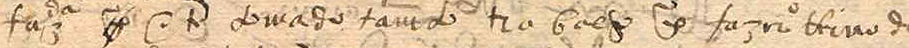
fazda p̄ e tē tomado tamto trabalho p̄ fazer o Reino de
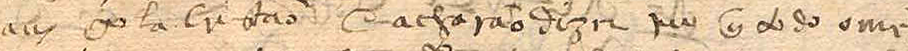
amgola Cristaõ e acharão dizer em q̄ todo omē
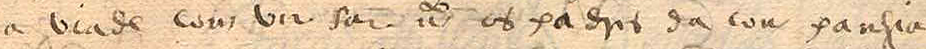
avia de comversar mto os padres da companhia
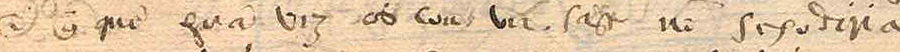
e q̄ quē huā vez os conversase nō se podiria
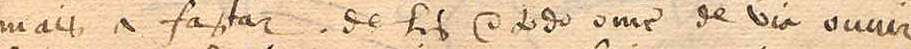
mais afastar deles e todo omē devia ouuir
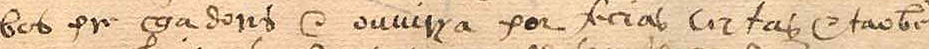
bos pregadores e ouuirya porfecias certas e taobē
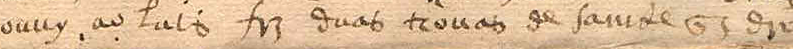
ouuy ao Luis frz duas trouas de samtesjdrō
